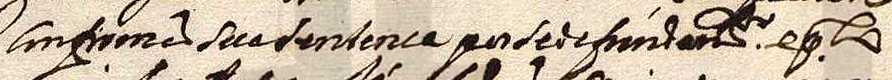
confirmaõ sua sentença por seos fundamtos. e p.lo
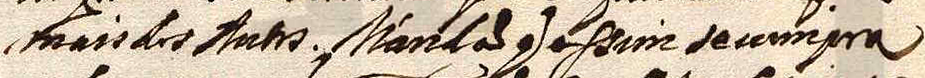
mais dos Autos. Mandaõ q̄ assim se cumpra
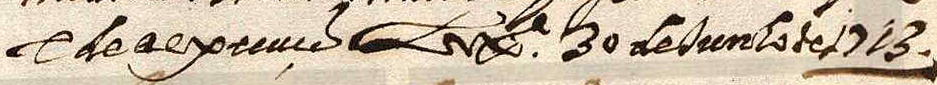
e de a execuçaõ Lix.a 30 de Iunho de i7i3.
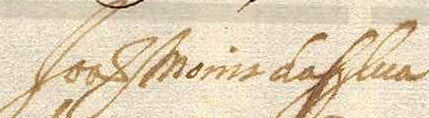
Joaõ Monis da sylua
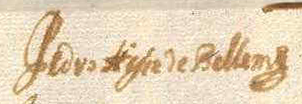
Pedro Hisse de Bellem
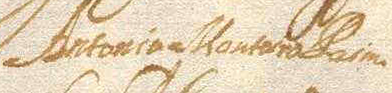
Antonio Monteiro Paim
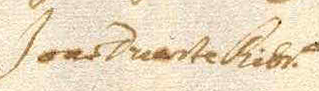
Ioaõ Duarte Ribr.o
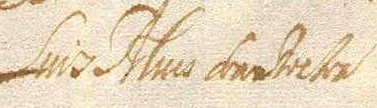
Luis Alues da Rocha
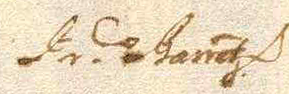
Fr.Co Barreto
